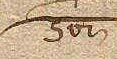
S̄or
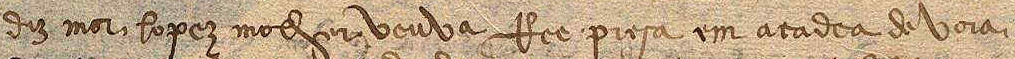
diz mor lopez molher veuva Ree. presa em a cadea devora
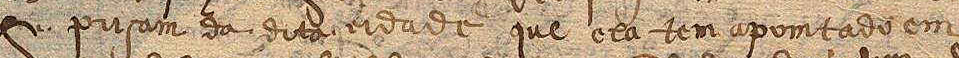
he prisam da dita cidade que ela tem apomtado em
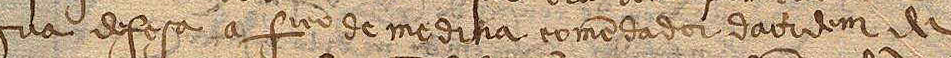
sua defesa a frco de medina comēdador da ordem de
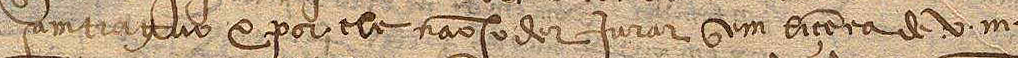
samtiaguo e por elle não poder Jurar sem liçēca de .v. m.
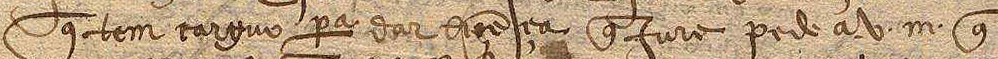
q̄ tem carguo ꝑa dar liçēça q̄ Jure pede a .v. m. q̄
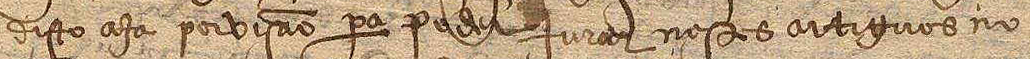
disto aJa porvisão ꝑa poder Jurar nestes artiguos no
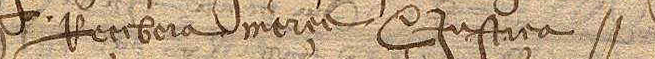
q̄ Reçebera merçe e Justiça //
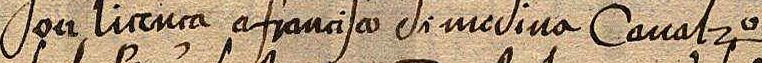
dou liçença a francisco de medina Caualro
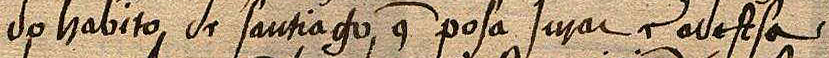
do habito de santiago q̄ posa Jurar ē a defesa
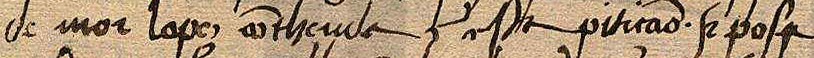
de mor lopez c̄otheuda ē esta pitição. e posa
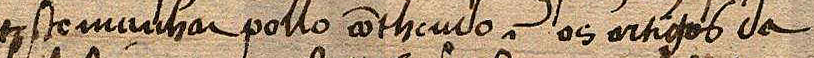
testemunhar pollo c̄otheudo ē os artigos da
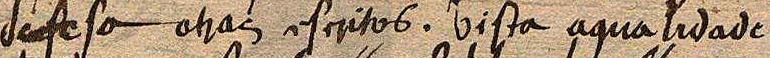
defesa atras escritos. vista a qualidade
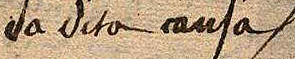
da dita causa /
